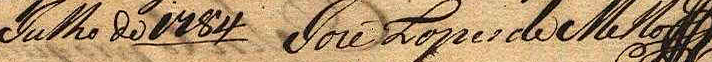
Iulho de 1784 Iozé Lopes de Mello
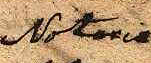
Notario
